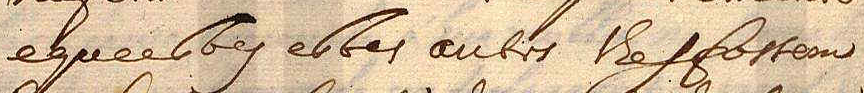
e que estes estes autos lhes fossem
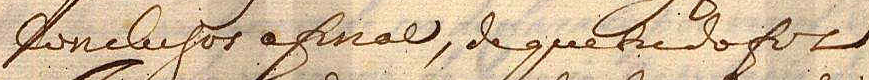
Conclusos a final, de que tudo fiz
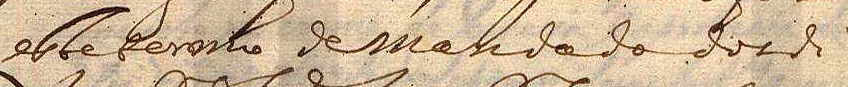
este termo de mandado dos di
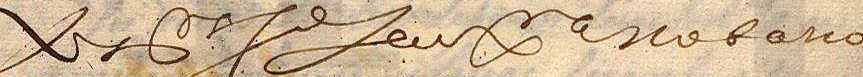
tos sres Jo teixra notario
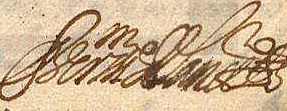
Berthmo de Lanctre
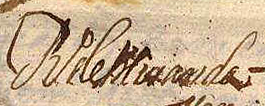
Ro de Miranda
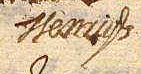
Henriq̄s
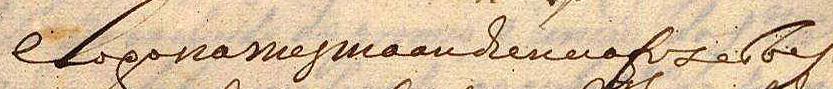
e logo na mesma audiencia fis estes
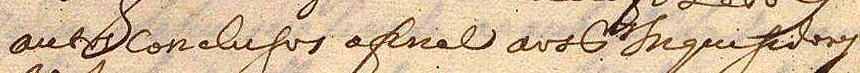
autos conclusos a final aos sres Inquisidores
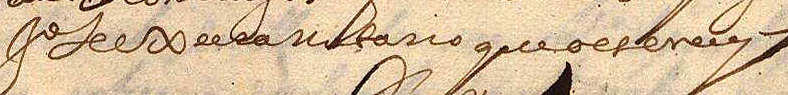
Jo teixeira notario que o escreuj
